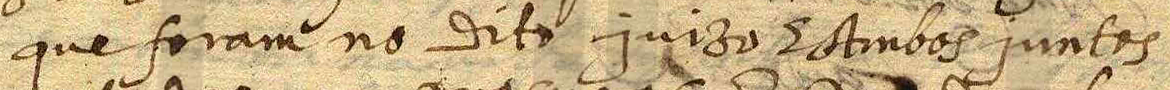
que foram no dito juizo E Ambos juntos
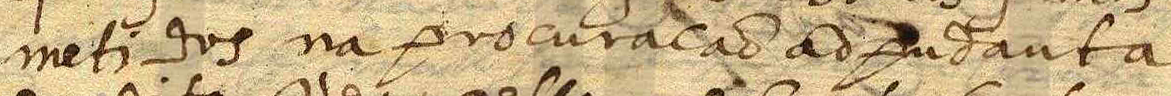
metidos na procuraçaõ adpud auta
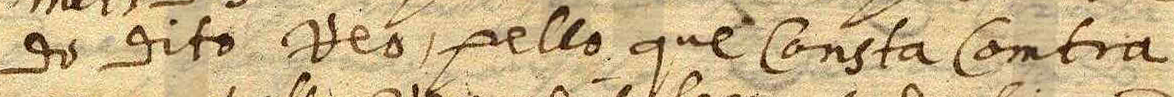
do dito Reo, pello que Consta Comtra
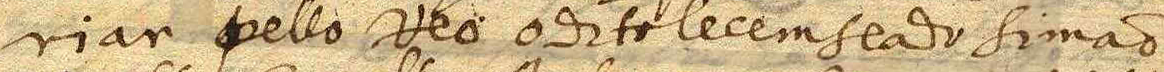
riar pello Reo o dito lecemseado simaõ
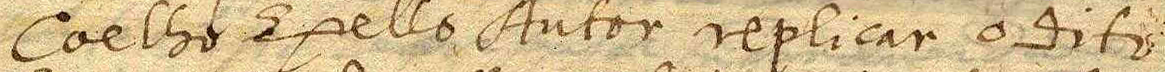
Coelho E pello Autor replicar o dito
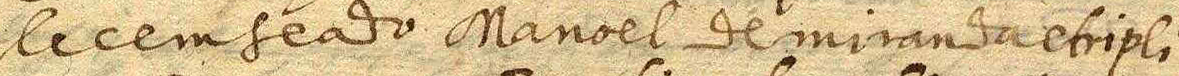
lecemseado Manoel de miranda e tripli
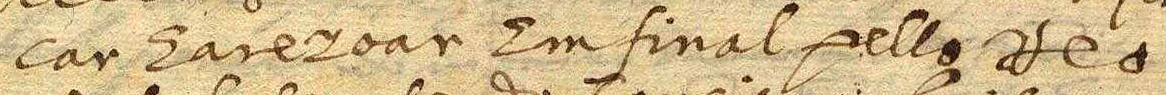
car E arezoar Em final pello Reo
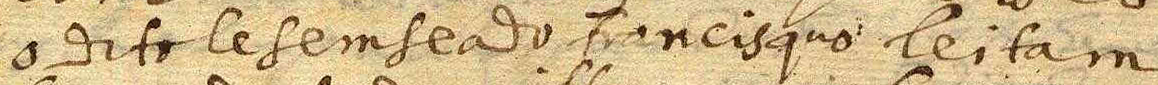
o dito lesemseado francisquo leitam
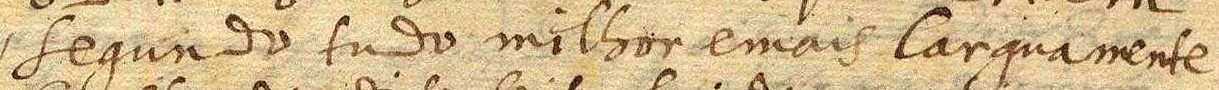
segundo tudo milhor e mais larguamente
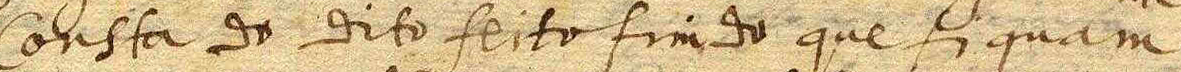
Consta do dito feito fimdo que fiquam
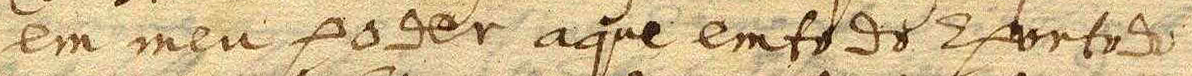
em meu poder a que em todo E por todo
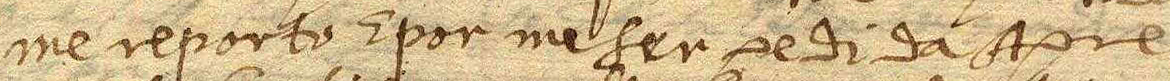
me reporto E por me ser pedida A pre
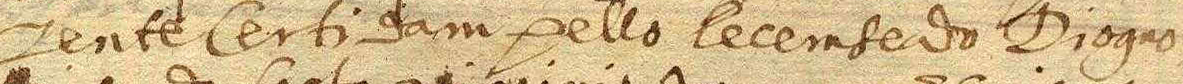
zente Certidam pello lecemseado Dioguo
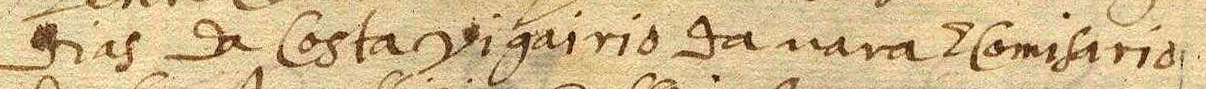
dias da Costa vigairio da uara E Comisario
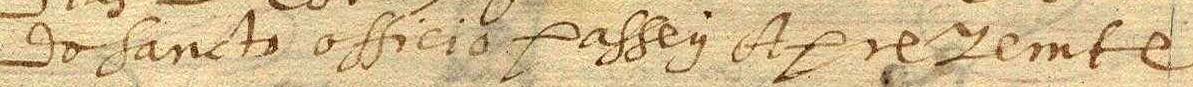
do sancto officio passey A prezemte
